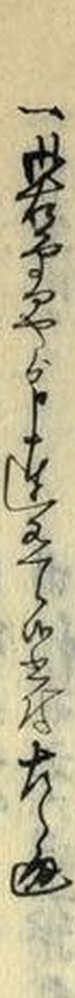一御右筆部屋ゟ申達有之候書付左之通
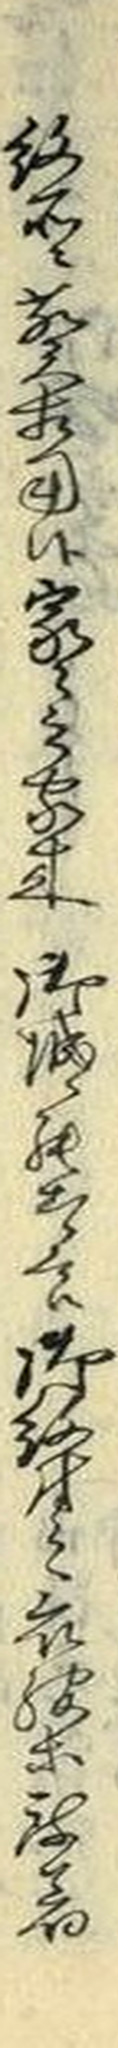紋所ニ葵相用候家々之家来御城へ罷出候節御紋付之衣服等致着
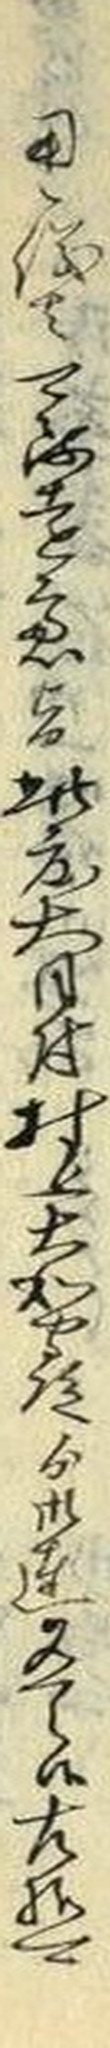用候儀者可致遠慮旨此度大目付村上大和守殿ゟ御達有之候左様可
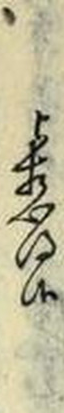被相心得候
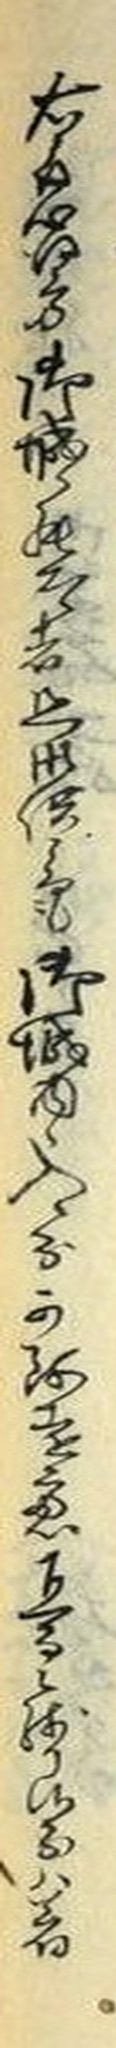右ニ付心得方御城へ罷出候者且御供ニ而も御城内へ入候分可致遠慮下馬ニ残り候分ハ着
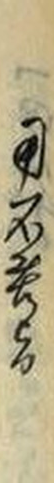用不苦旨
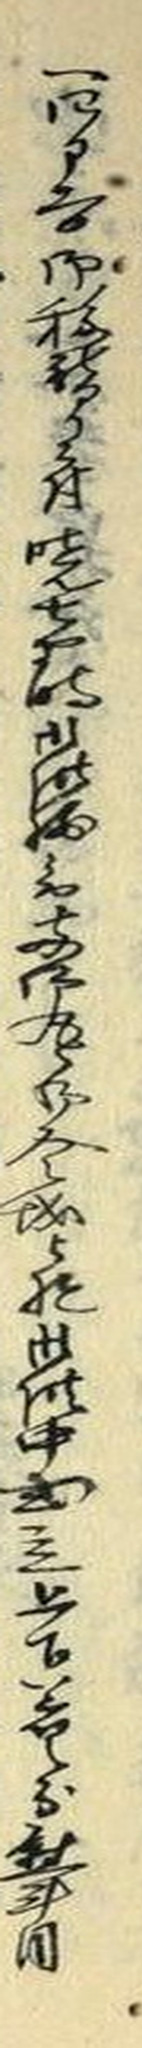一四月二日御移替りニ付暁七半時御供揃ニ而両御丸へ御登城被遊御供中式立上下着之分熨斗目
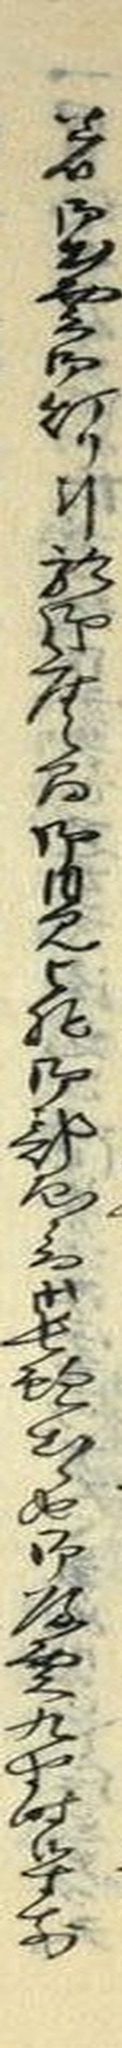着御出殿御灯り引於御座之間御目見被遊御部屋ニ而御長鮑出候由御帰殿九半時弐寸前
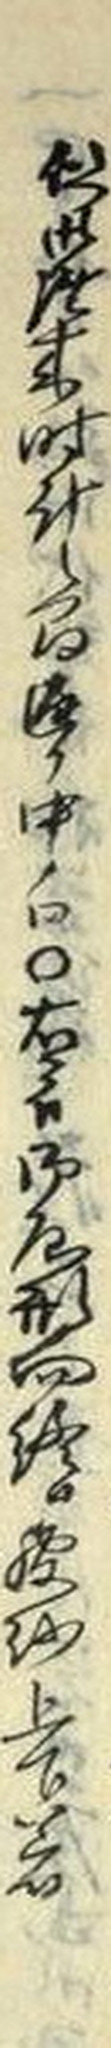但御往来時計之間通り中ノ口〇右ニ付御屋形向終日服紗上下着
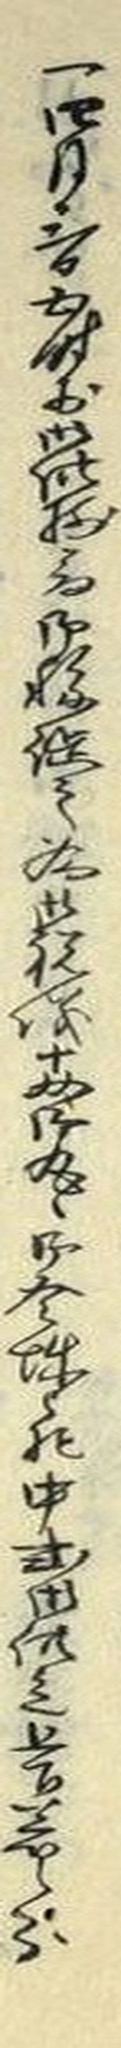一四月三日五時前御供揃ニ而御移徒之御祝儀両御丸へ御登城被遊中式御供立上下着之分
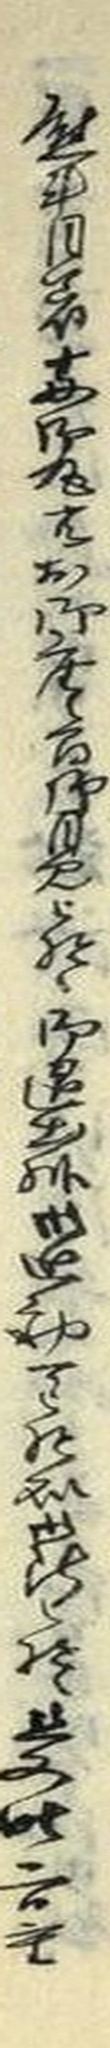熨斗目着両御丸共於御座之間御目見被遊候御退出掛御廻勤可被遊処御断被遊候且又昨二日重
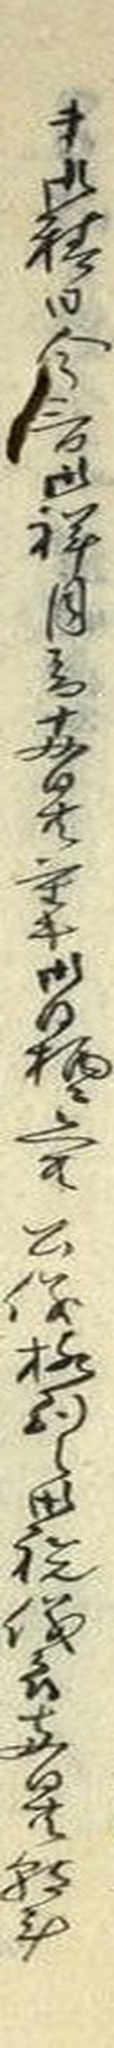キ御精日今三日御祥月ニ而両日共重キ御日柄ニ候へ共公儀格別之御祝儀ニ付両日共朝斗
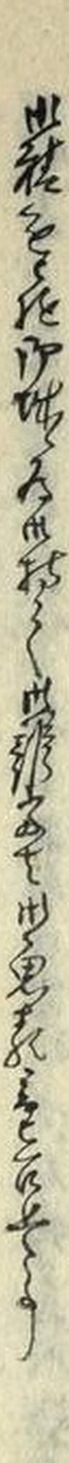御精進被遊御城へ為御持之御弁当者御魚類ニ而被召上候事
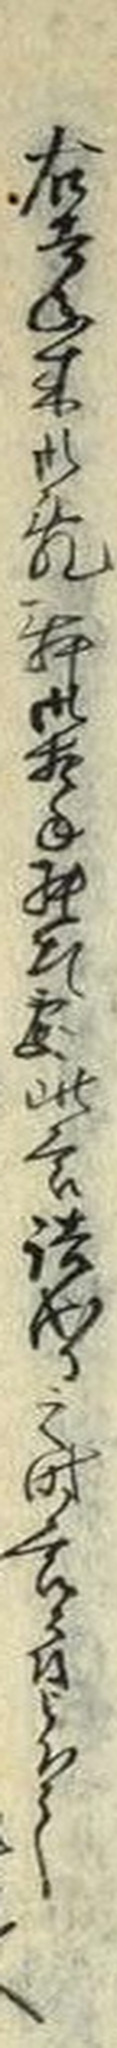右去年来御乱舞御相手罷出候処此節諸代り之時節ニ付被下之

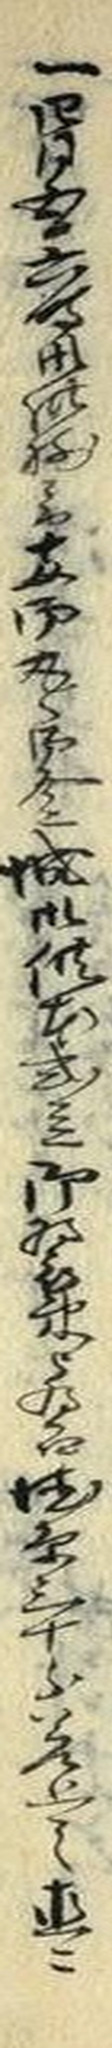一四月五日六時御供揃ニ而両御丸へ御登城御供本式立御装束被為召埴原三十郎差上之直ニ
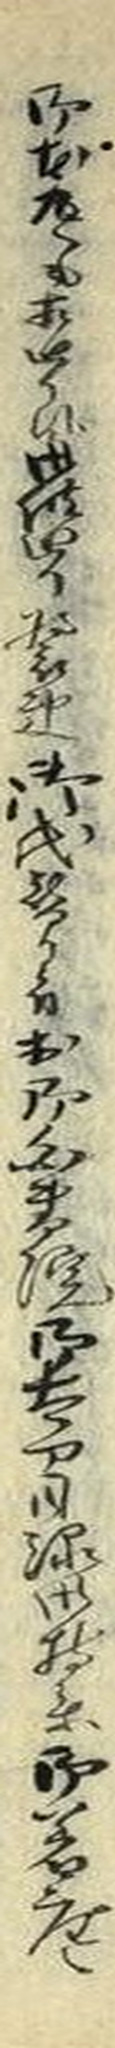御本丸へも相廻り候御供廻り装束御代替りニ付於御白書院御太刀目録御持参御着座之
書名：少傅日録抄（斉善付側向頭取日記、在府）
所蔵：福井県文書館 Fukui Prefectural Archives
